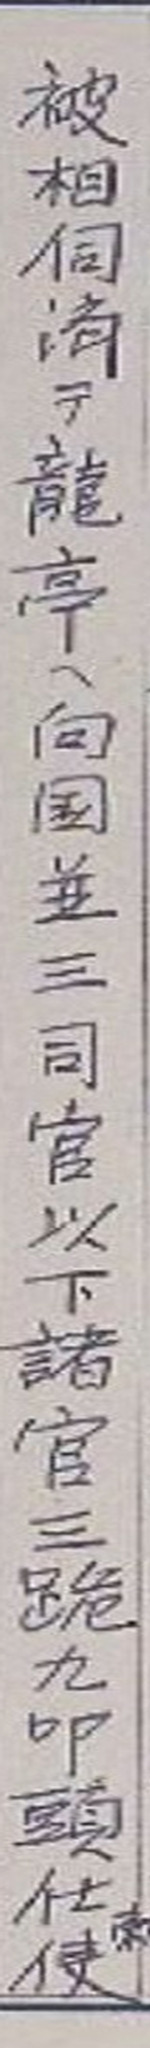被相伺済て龍亭へ向国並三司官以下諸官三跪九叩頭仕勅使

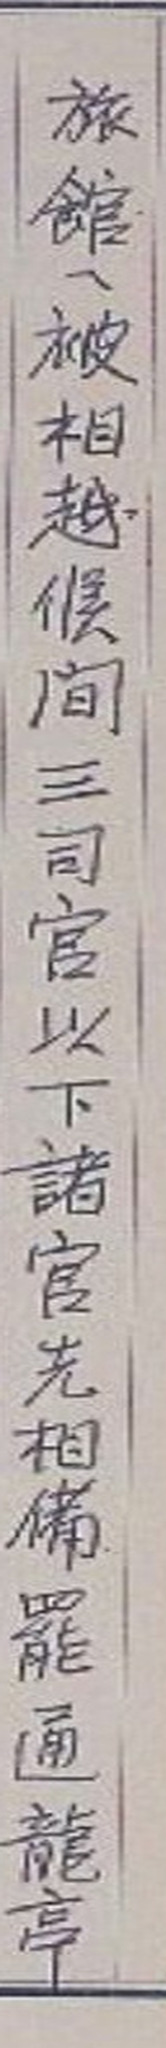旅館へ被相越候間三司官以下諸官先相備罷通龍亭
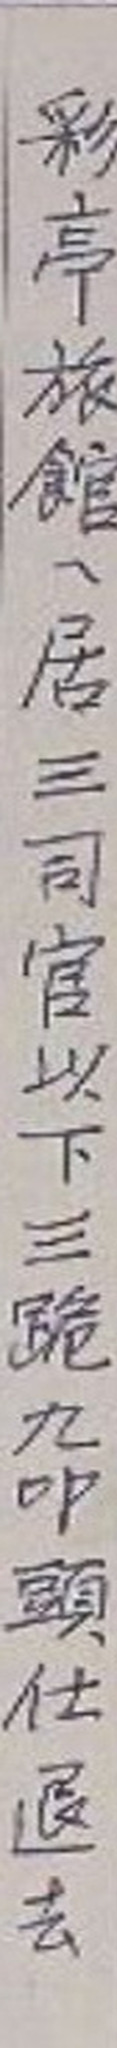彩亭旅館へ居三司官以下三跪九叩頭仕退去
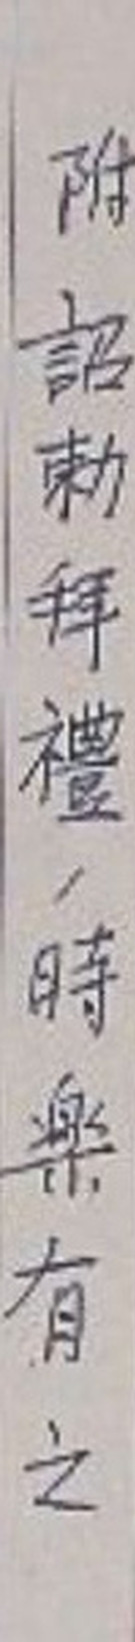附詔勅拝礼の時楽有之
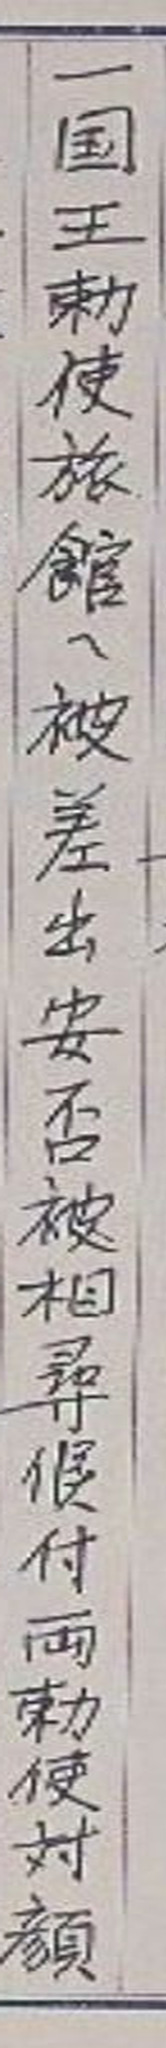一国王勅使旅館へ被差出安否被相尋候付両勅使対顔
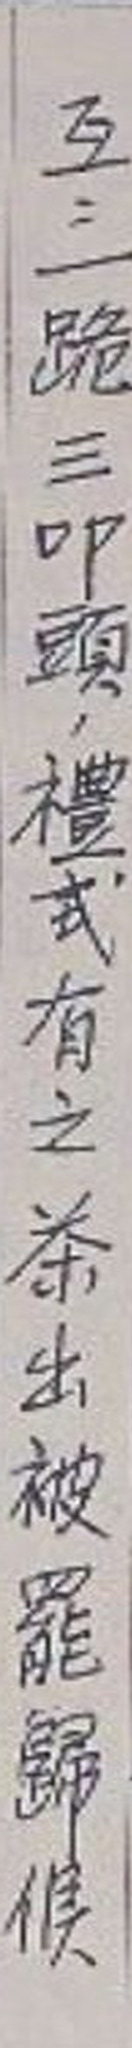互に一跪三叩頭の礼式有之茶出被罷帰候
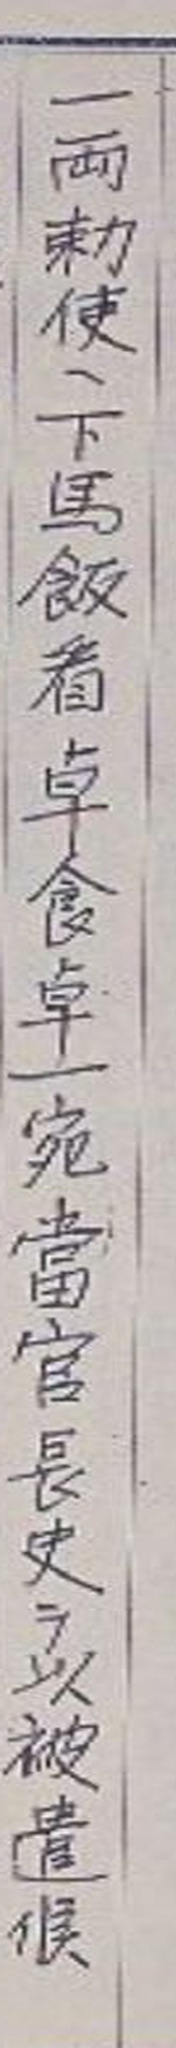一両勅使へ下馬飯看卓食卓一宛当官長史を以被遣候
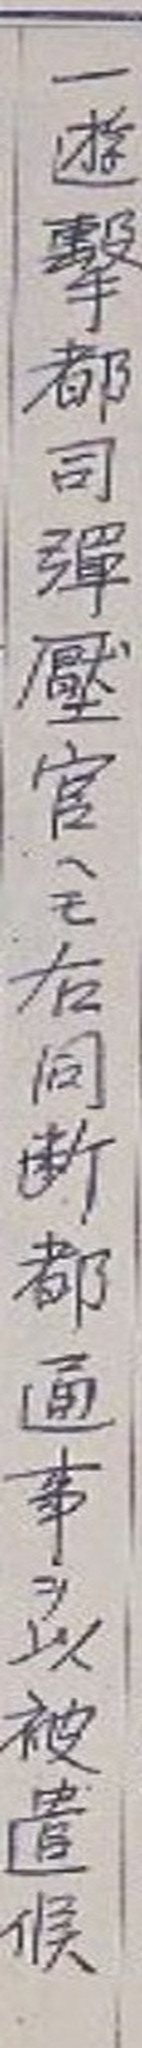一遊撃都司弾圧官へも右同断都通事を以被遣候
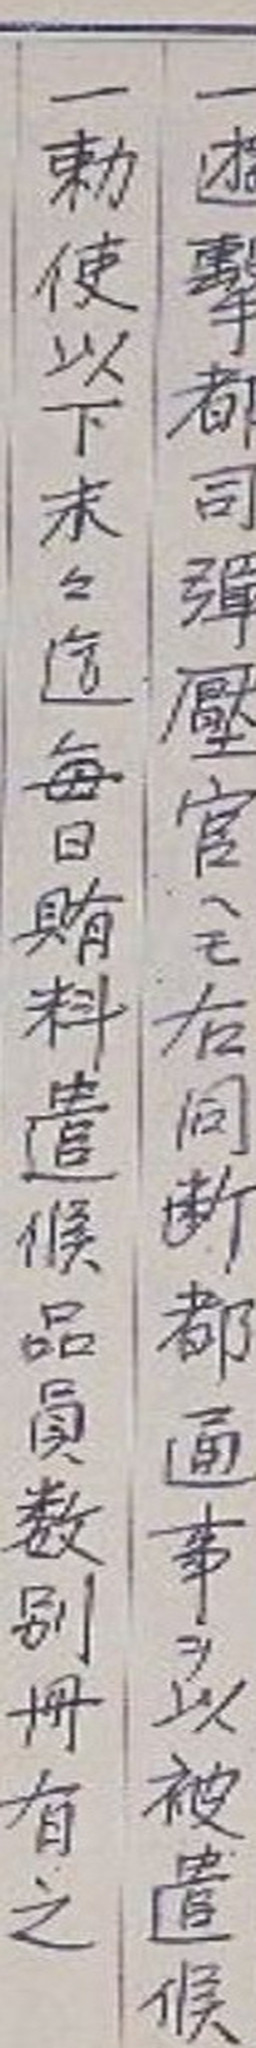一勅使以下末々迄毎日賄料遣候品員数別冊有之
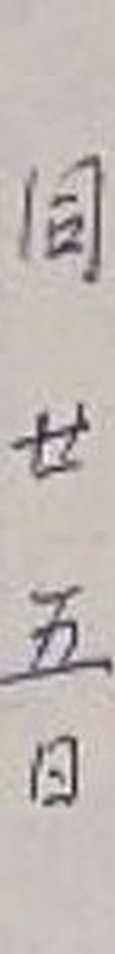同廿五日
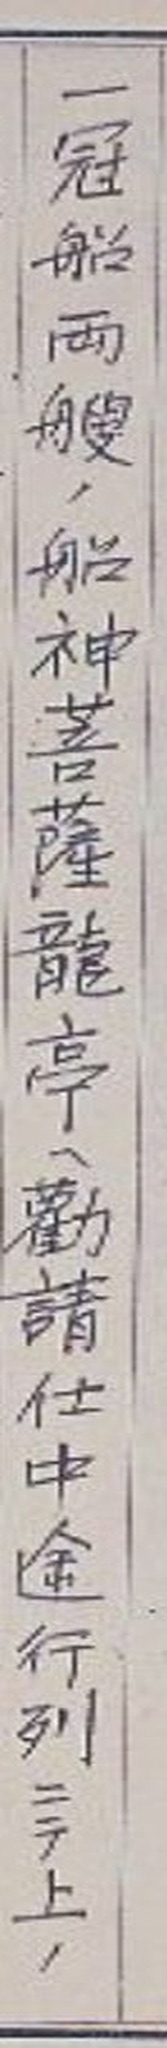一冠船両艘の船神菩薩龍亭へ勧請仕中途行列にて上の
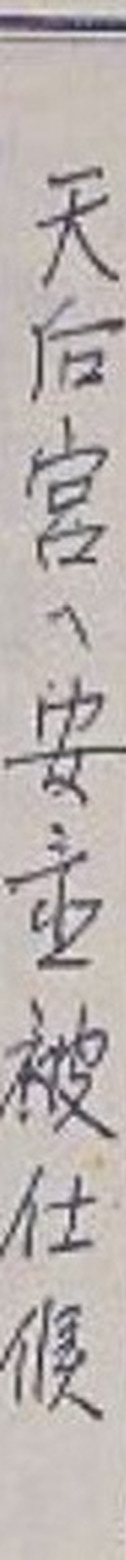天后宮へ安置被仕候
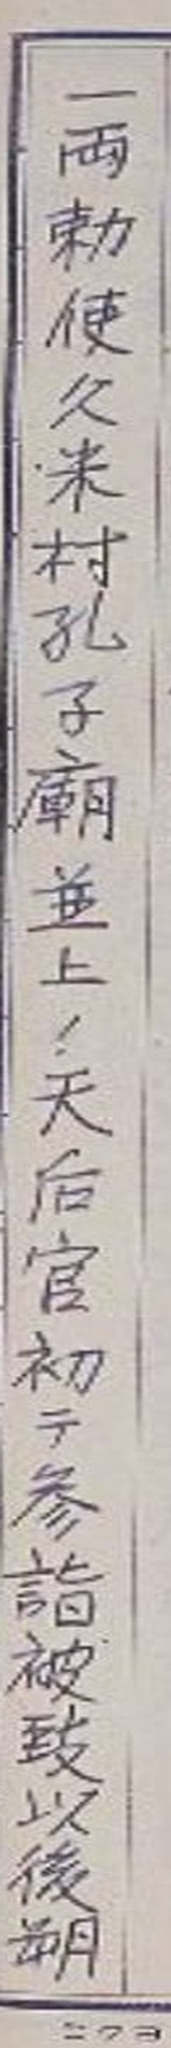一両勅使久米村孔子廟並上の天后官初て参詣被致以後朔
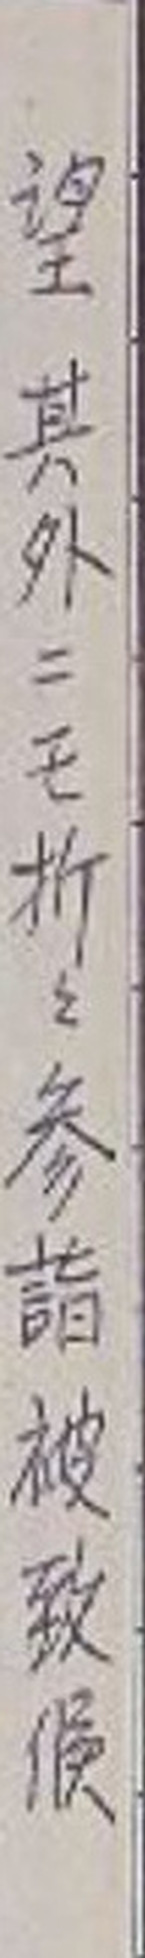望其外にも折々参詣被致候
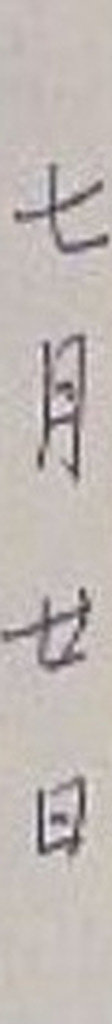七月廿日
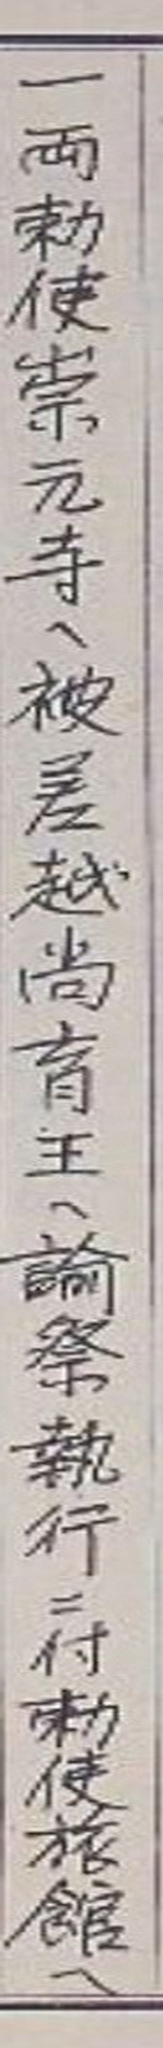一両勅使崇元寺へ被差越尚育王へ諭祭執行に付勅使旅館へ
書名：支那冊封使来琉諸記 下巻
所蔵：University of the Ryukyus Library
